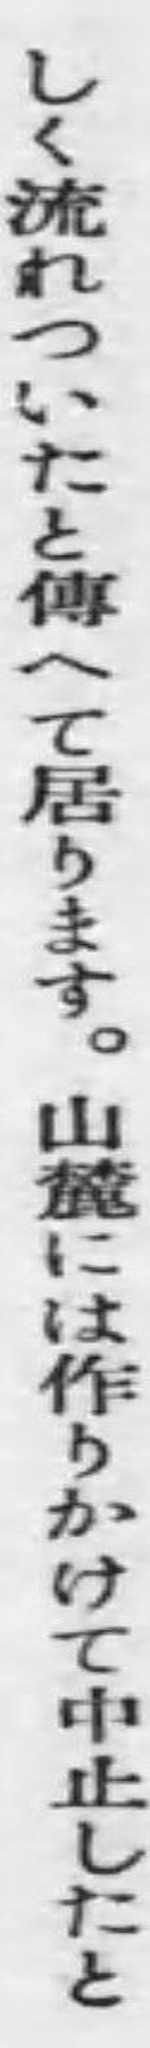しく流れついたと伝へて居ります。山麓には作りかけて中止したと
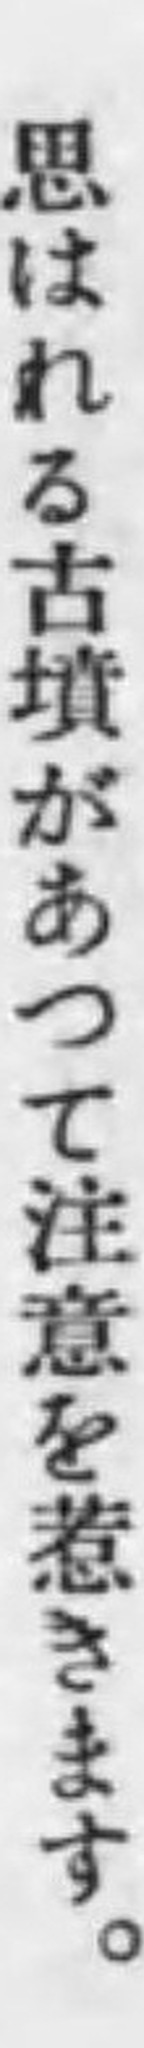思はれる古墳があつて注意を惹きます。
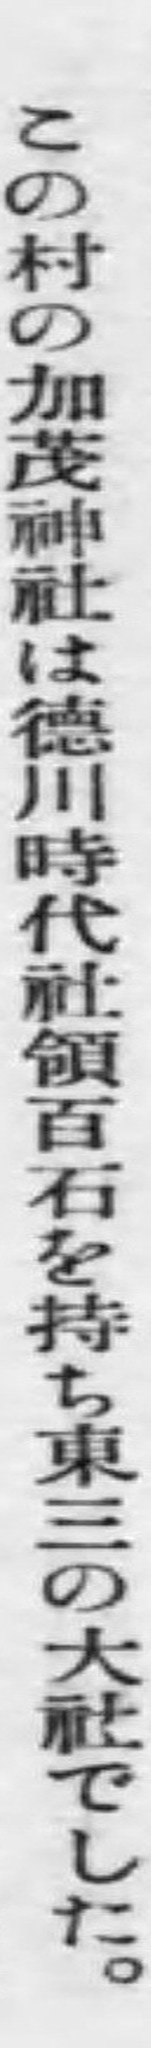この村の加茂神社は徳川時代社領百石を持ち東三の大社でした。
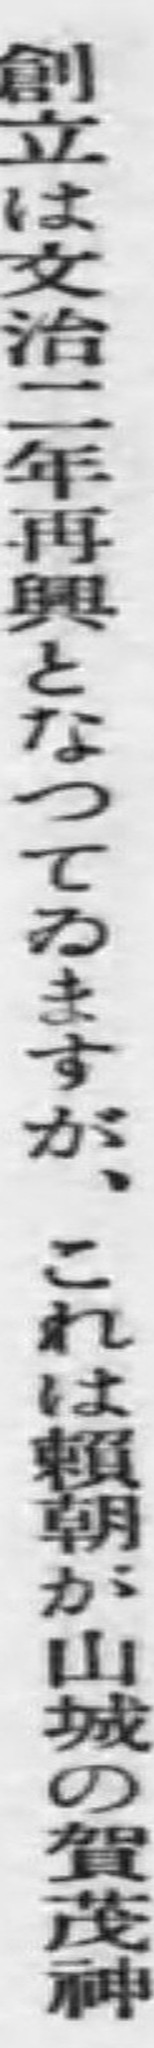創立は文治二年再興となつてゐますが、これは頼朝が山城の賀茂神
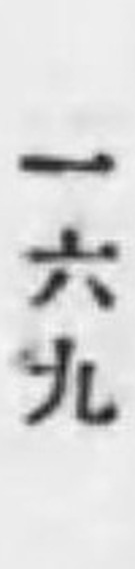一六九

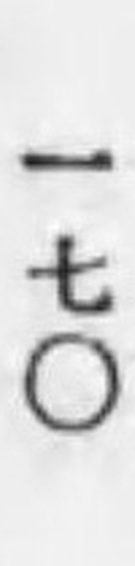一七〇
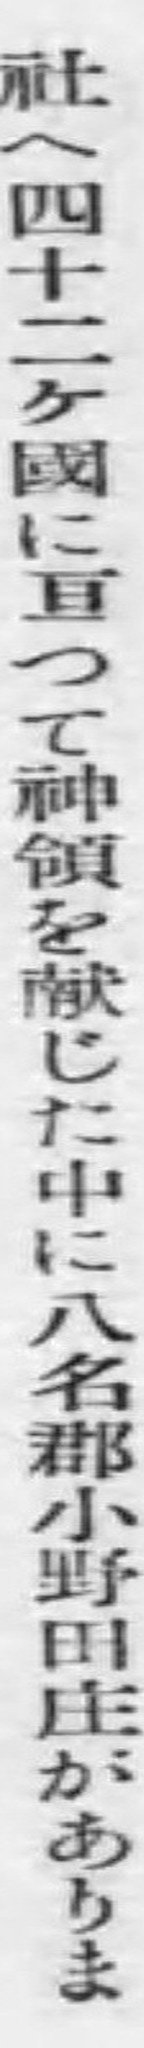社へ四十二ヶ国に亘つて神領を献じた中に八名郡小野田庄がありま
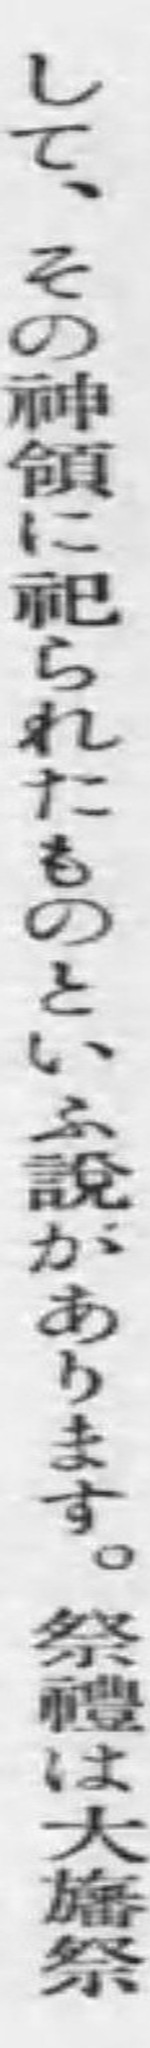して、その神領に祀られたものといふ説があります。祭礼は大旛祭
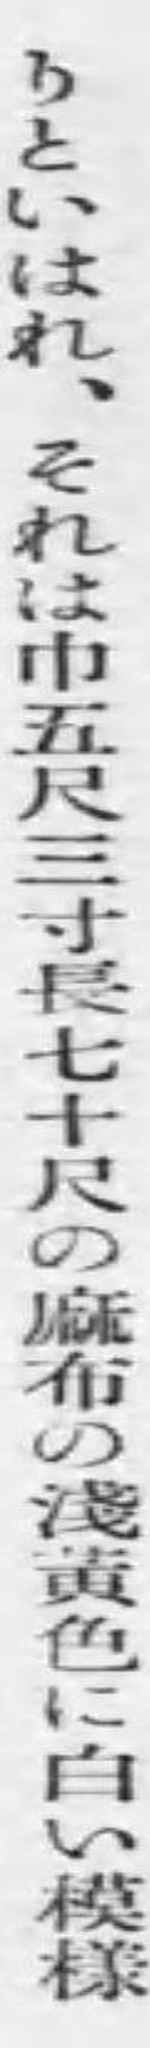りといはれ、それは巾五尺三寸長七十尺の麻布の浅黄色に白い模様
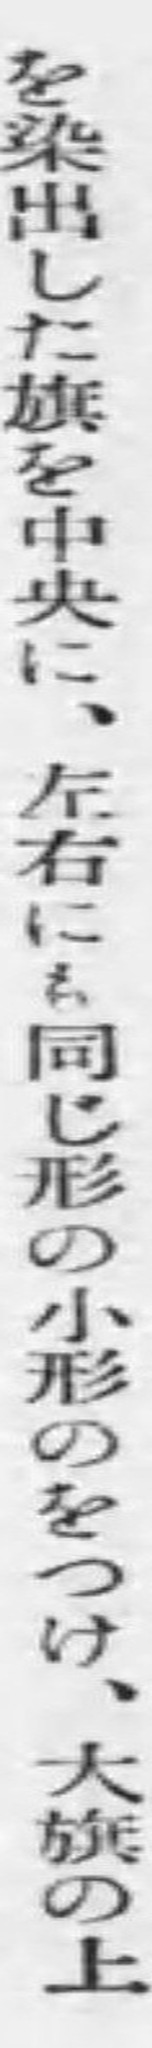を染出した旗を中央に、左右にも同じ形の小形のをつけ、大旗の上
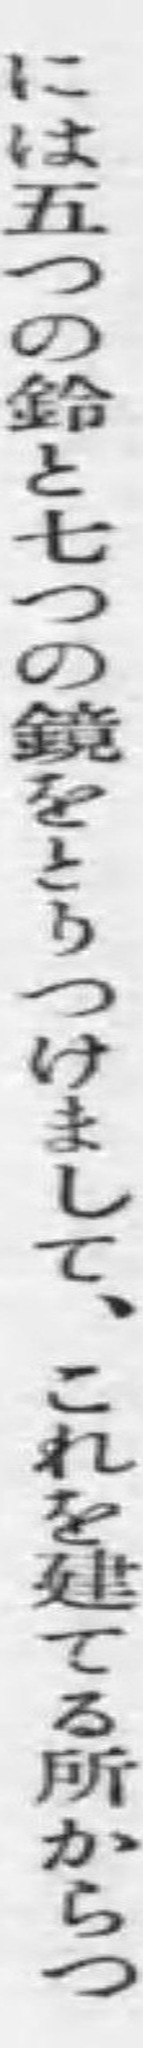には五つの鈴と七つの鏡をとりつけまして、これを建てる所からつ
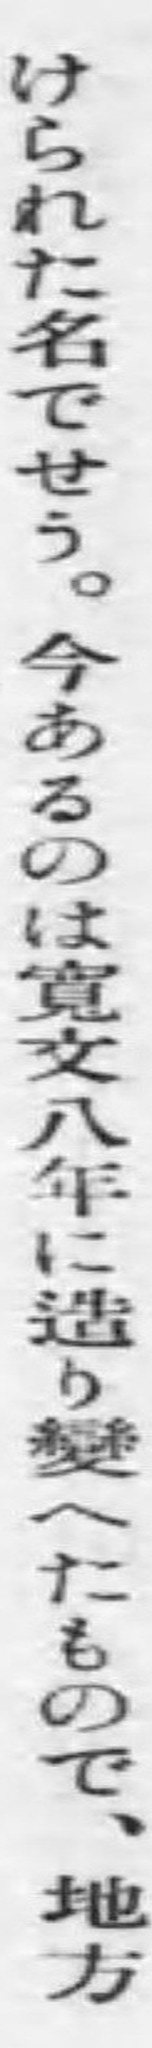けられた名でせう。今あるのは寛文八年に造り変へたもので、地方
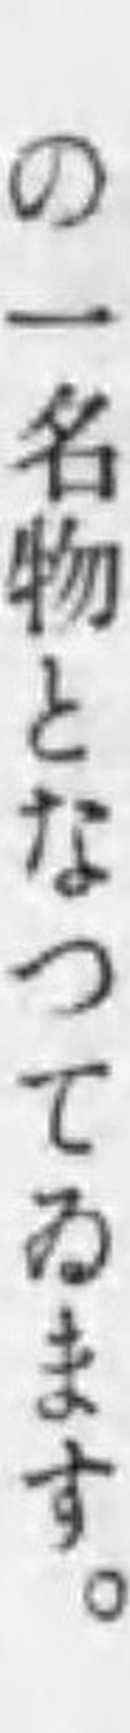の一名物となつてゐます。
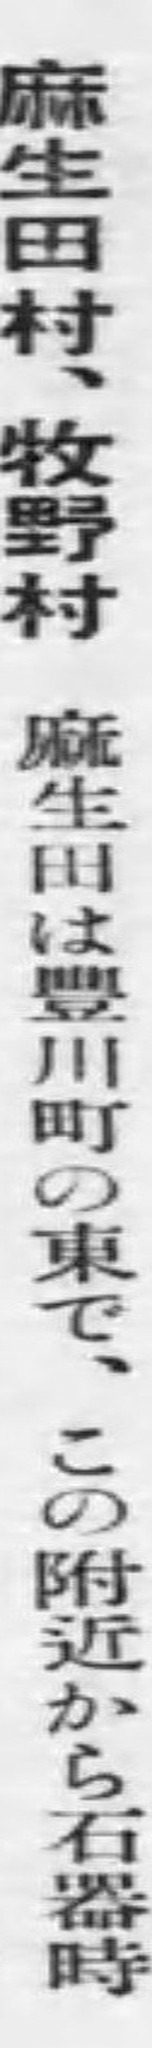麻生田村、牧野村麻生田は豊川町の東で、この附近から石器時
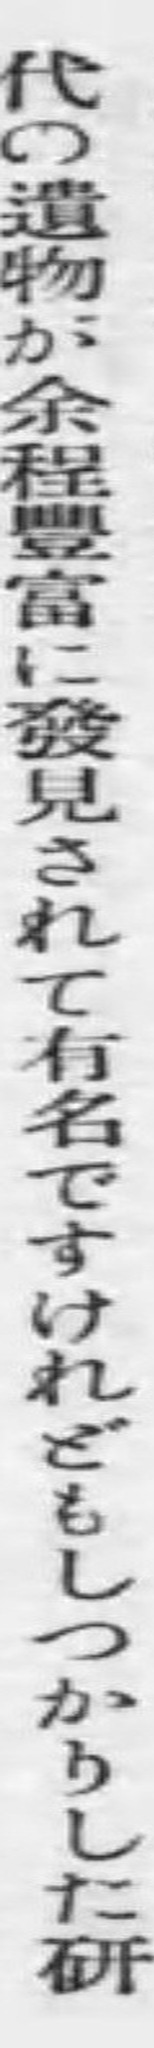代の遺物が余程豊富に発見されて有名ですけれどもしつかりした研
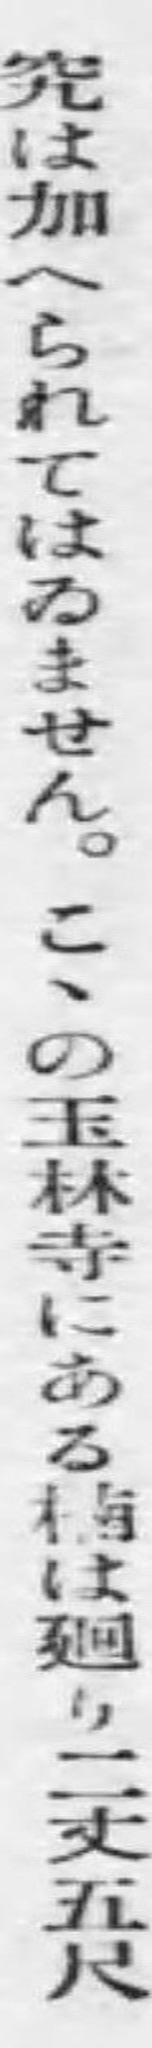究は加へられてはゐません。こゝの玉林寺にある楠は廻り二丈五尺
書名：東三河道中記 : 豊橋市及其附近案内
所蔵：国立国会図書館 National Diet Library, JAPAN
